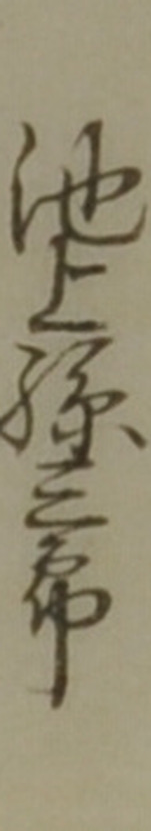池上孫三郎
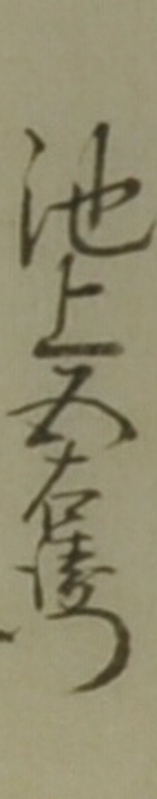池上五右衛門

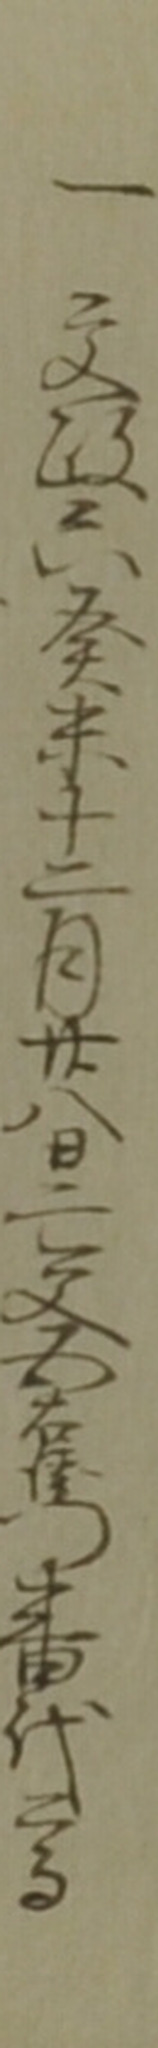一文政六癸未十二月廿八日亡父五右衛門番代高
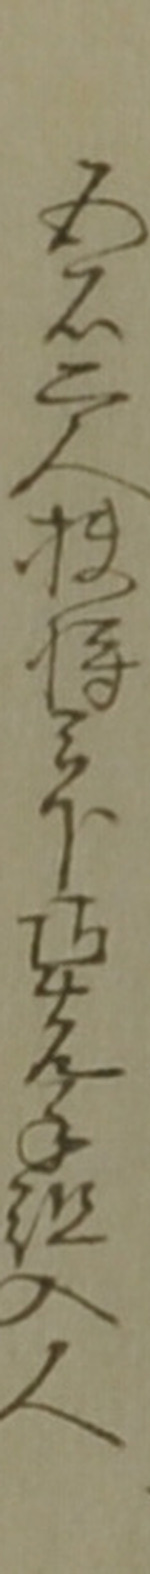五石二人扶持被下御先年組入人
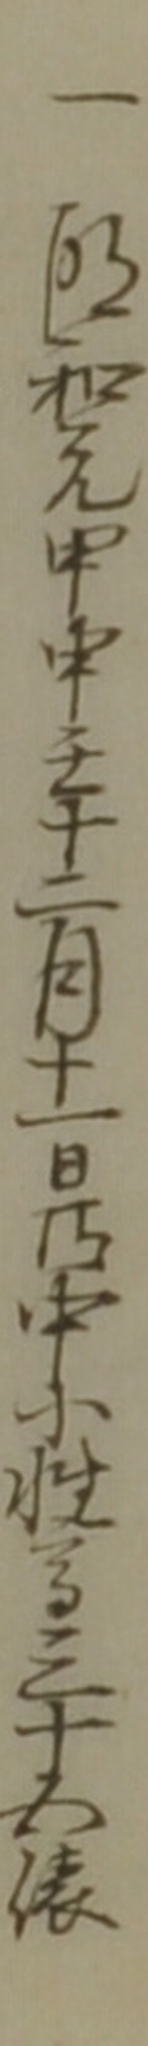一明和元甲申閏十二月十一日御中小性高三十五俵
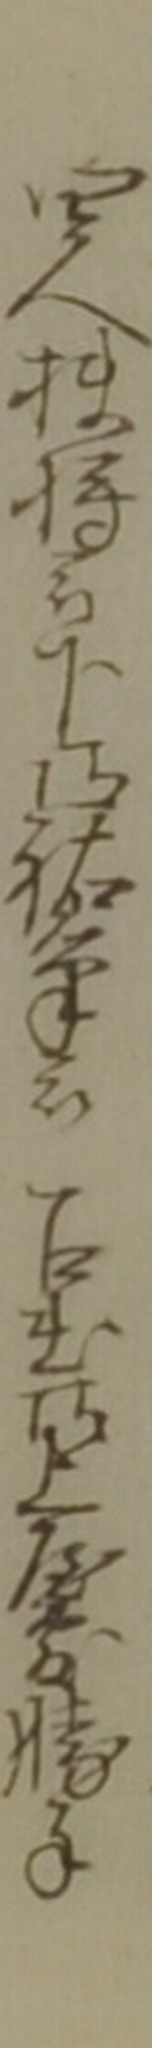四人扶持被下御祐筆被召出御上屋敷勝手
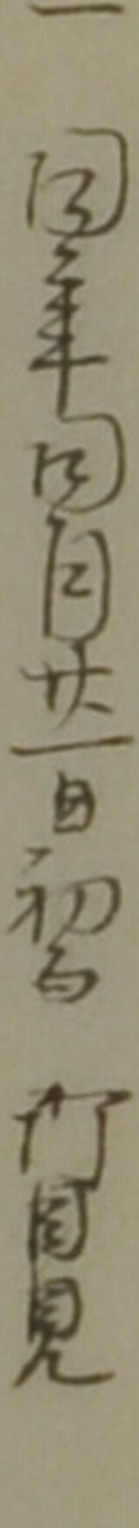一同年同月廿一日初而御目見
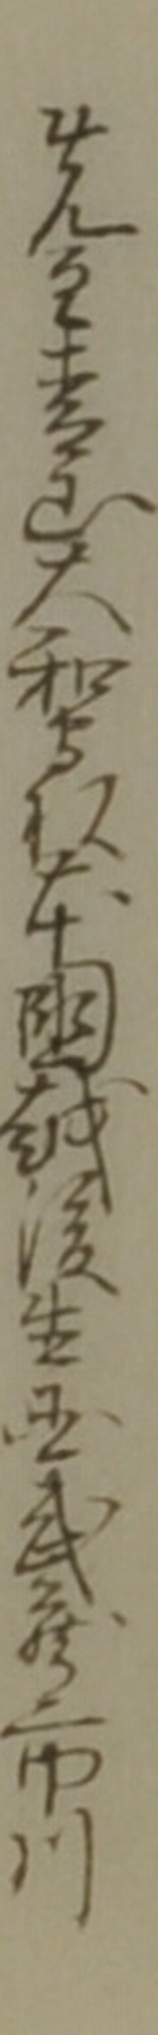先主青山大和守様本国越後生国武蔵市川
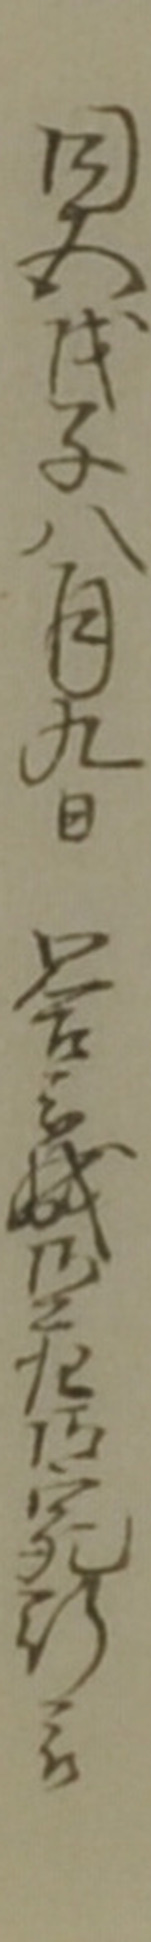一同五戊子八月九日思召被成御座御宛行被
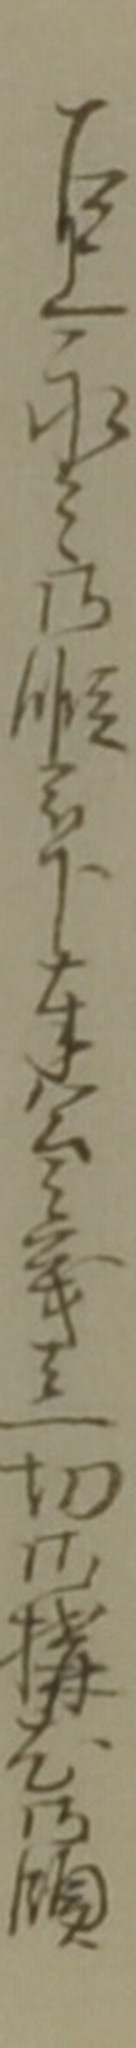召上永之御暇被下奉公之義者一切御構尤御領
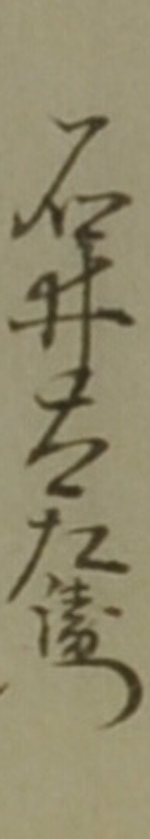石井太左衛門

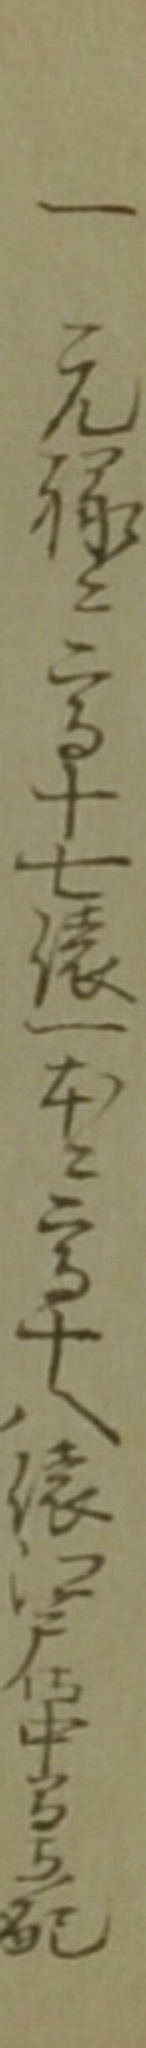一元禄高十七俵一本高十八俵江戸御中間支配
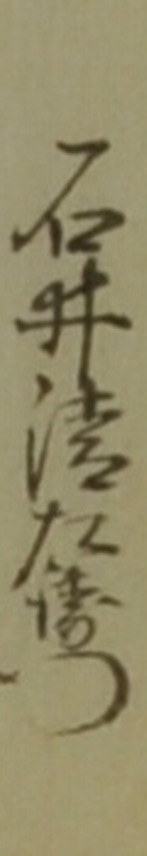石井清左衛門
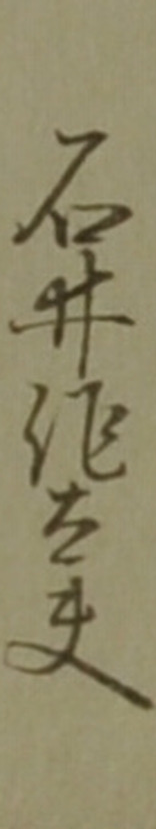石井作太夫
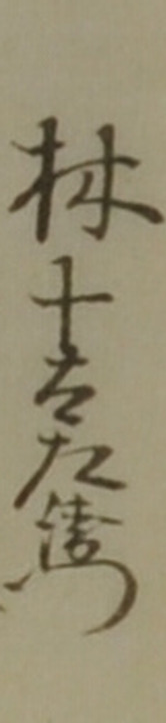林十太左衛門
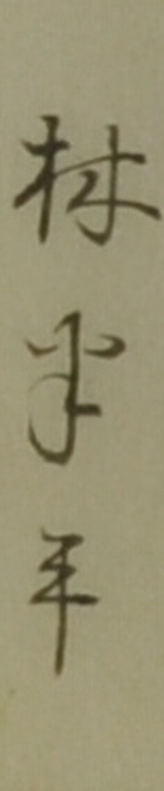林半平
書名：無足廃家（弐）
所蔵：伊那市立高遠町図書館・合同会社AMANE
